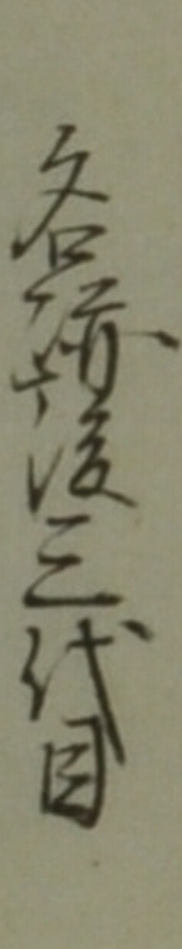名跡後三代目
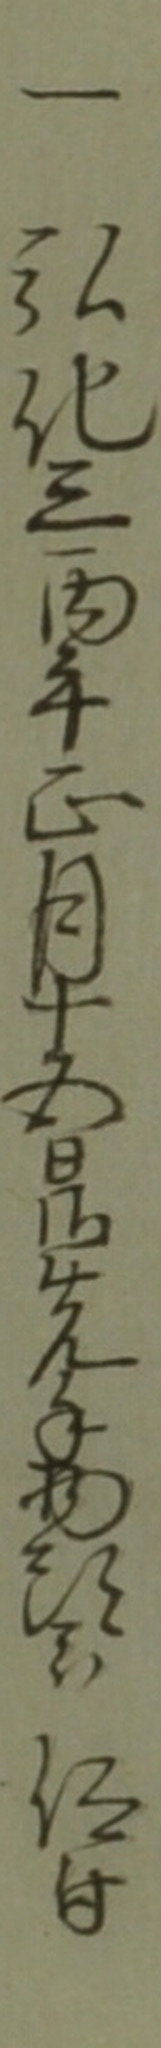一弘化三丙午正月十五日御先手物頭被仰付
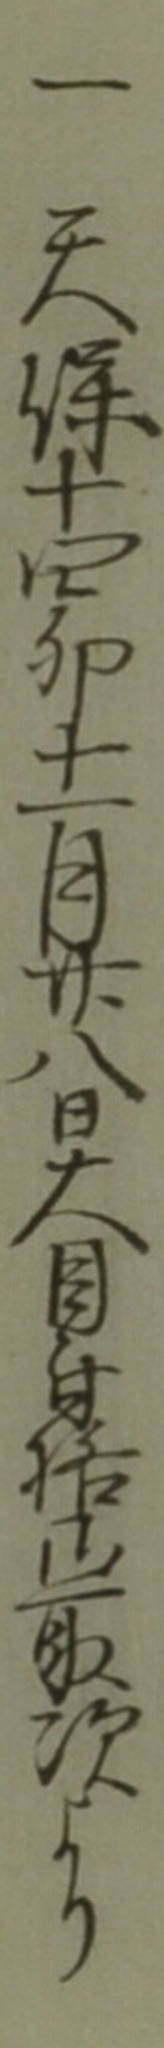一天保十四卯十一月廿八日大目付格御取次より
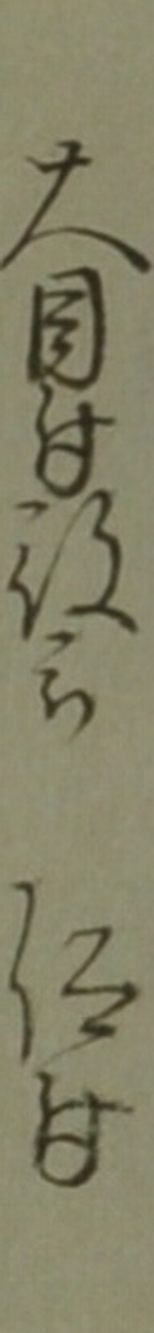大目付役被仰付
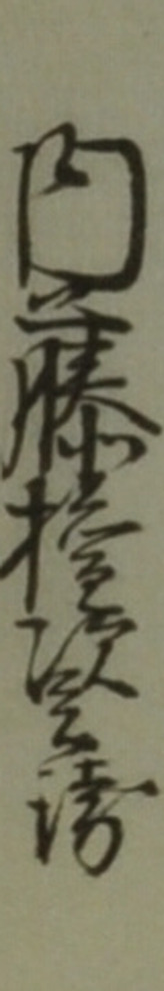内藤権次兵衛
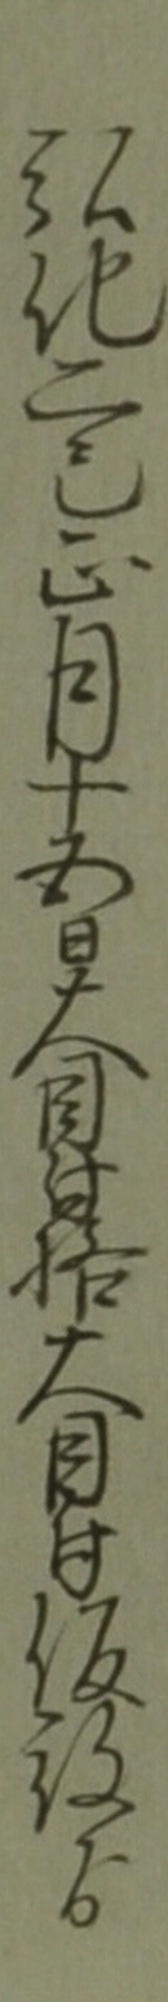一弘化二巳正月十五日大目付格大目付仮役ゟ
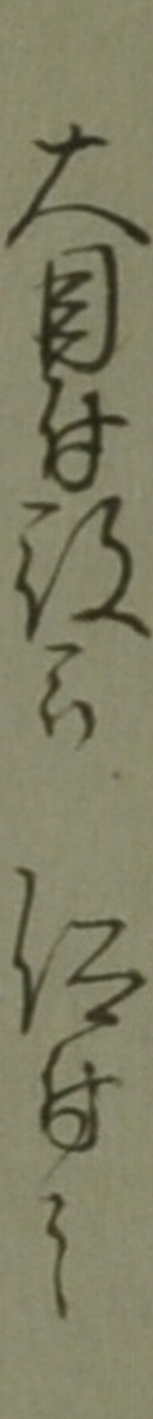大目付役被仰付之
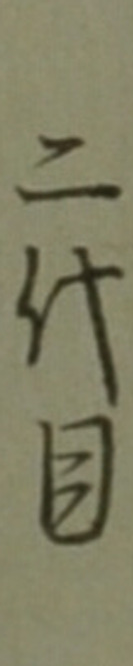二代目
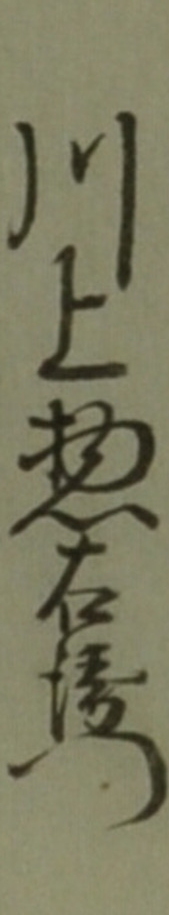川上惣右衛門
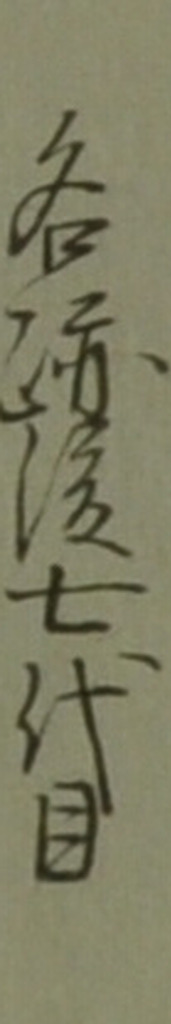名跡後七代目
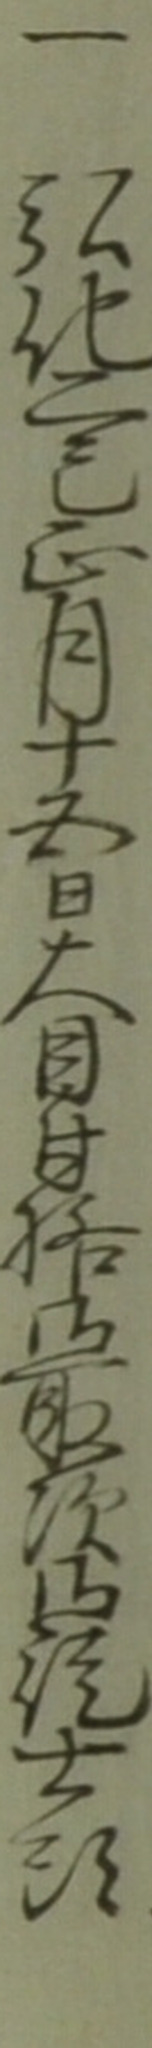一弘化二巳正月十五日大目付格御取次御徒士頭
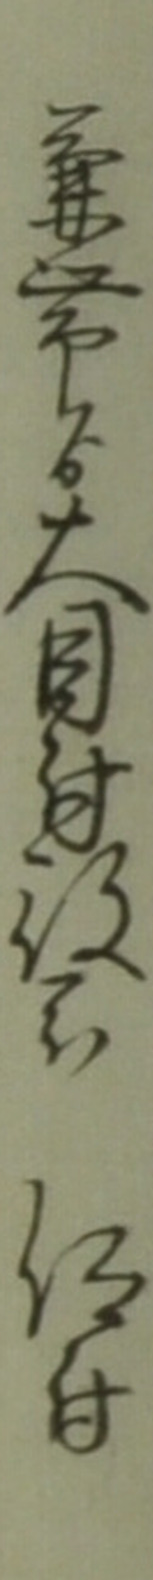兼帯ゟ大目付役被仰付
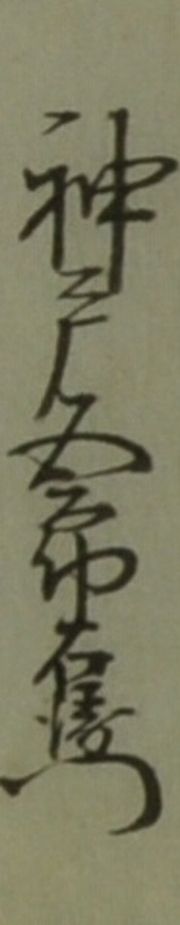神戸五郎右衛門

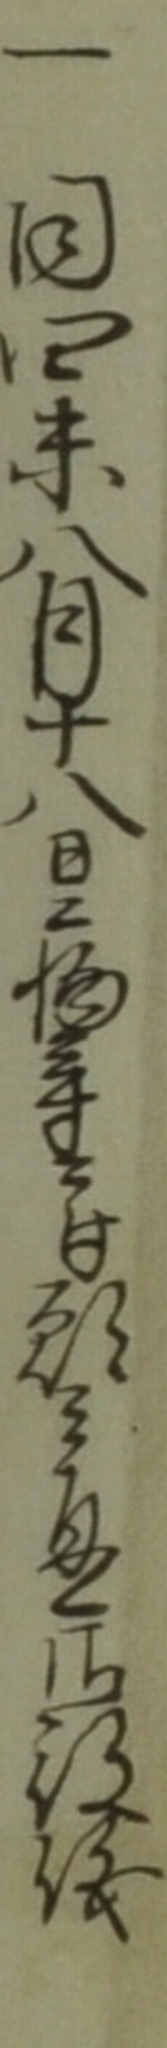一同四未八月十八日病気ニ付願之通御役儀
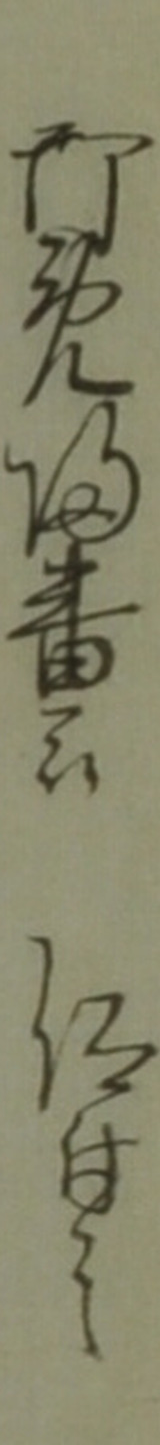御免帰番被仰付之
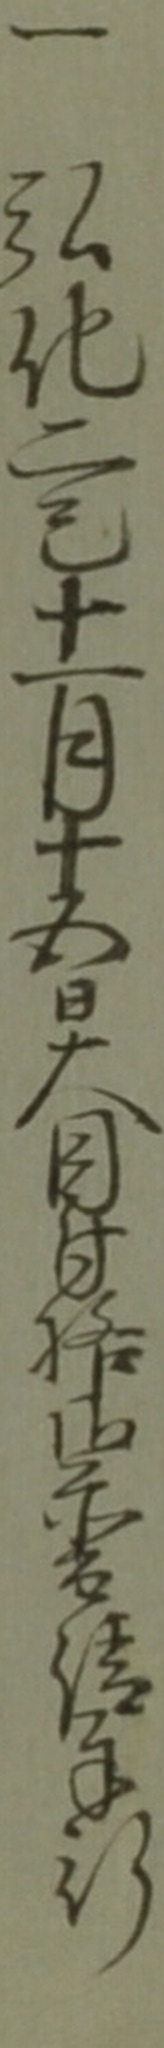一弘化二巳十一月十五日大目付格御御普請奉行
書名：諸御役代々録（三）
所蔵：伊那市立高遠町図書館・合同会社AMANE
